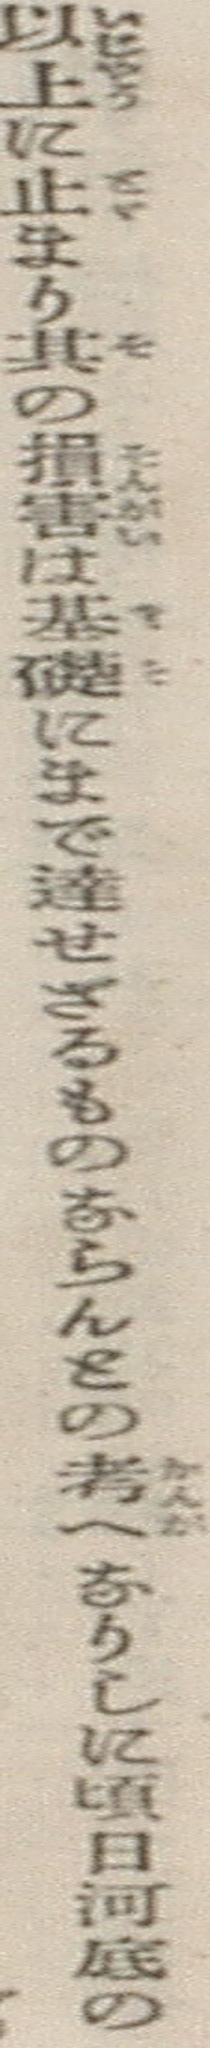以上に止まり其の損害は基礎にまで達せざるものならんとの考へなりしに日頃河底の
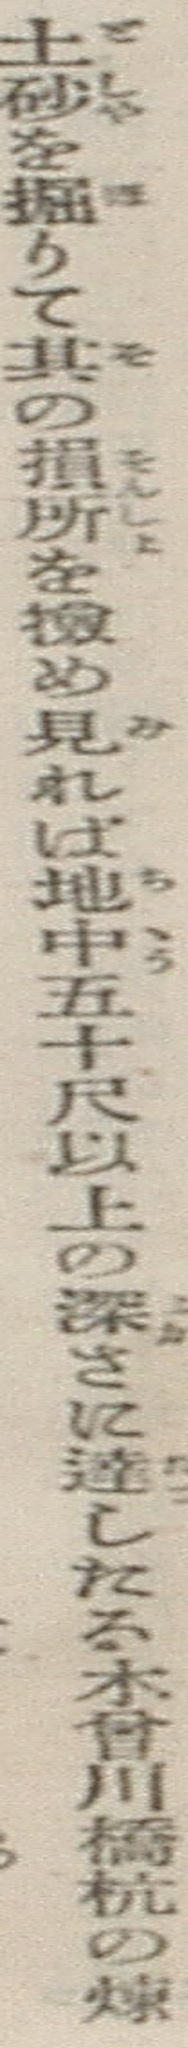土砂を掘りて其の損所を撿め見れば地中五十尺以上の深さに達したる木曽川橋杭の煉
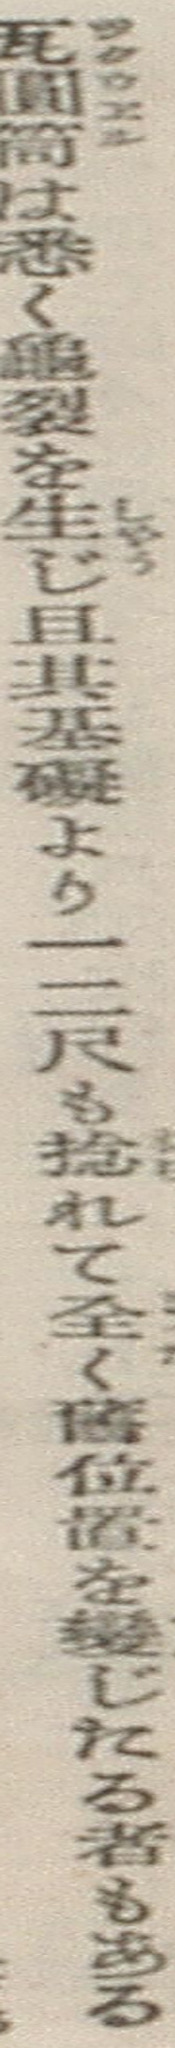瓦圓筒は悉く亀裂を生じ且其基礎より一二尺も捻れて全く旧位置を変じたる者もある
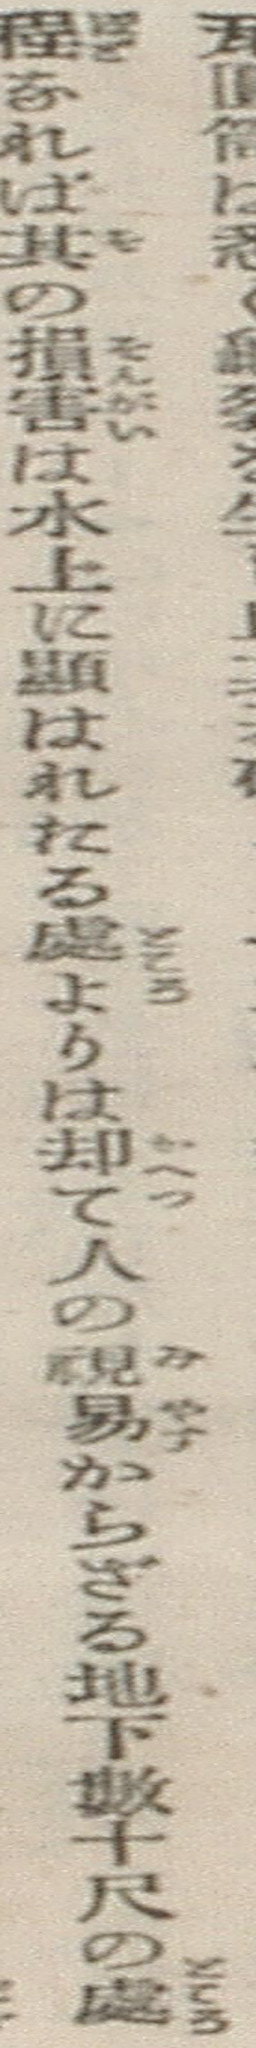程なれば其の損害は水上に顕れたる處よりは却て人の視易からざる地下數十尺の處
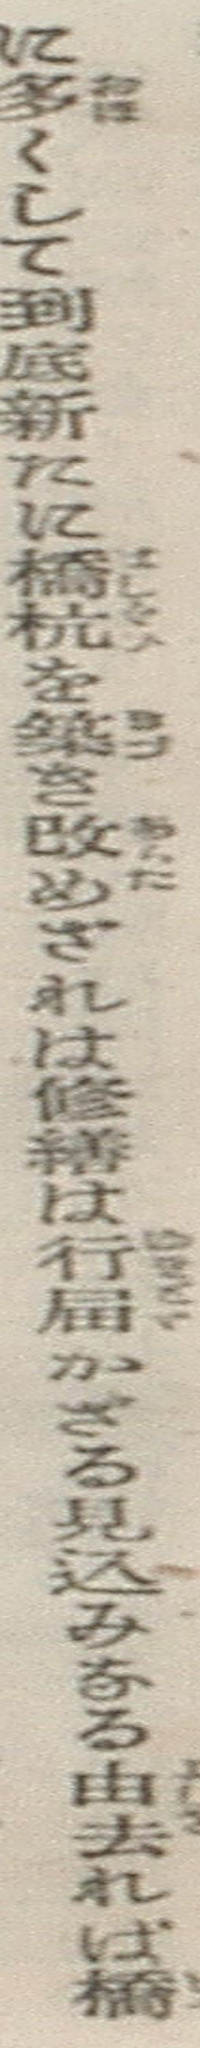に多くして到底新たに橋杭を築き改めざれば修繕は行届からざる見込みなる由去れば橋
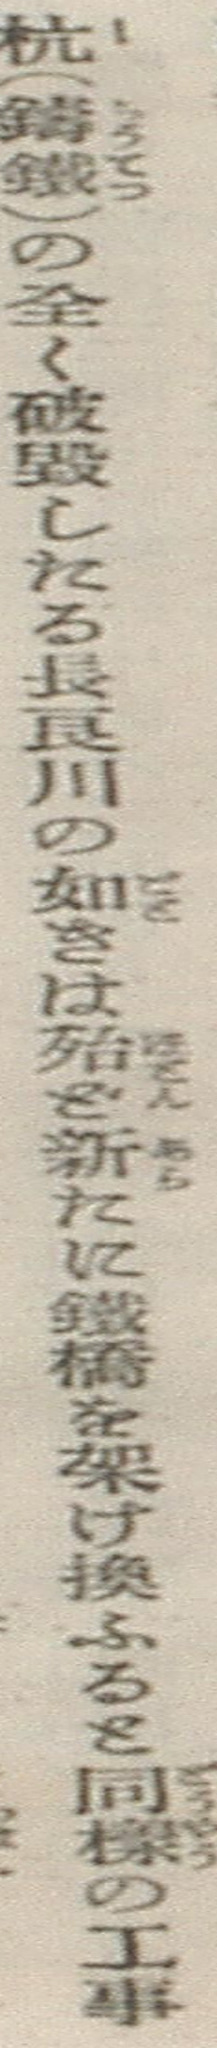杭）の全く破毀したる長良川の如きは殆ど新たに鐡橋を架け換ふると同様の工事
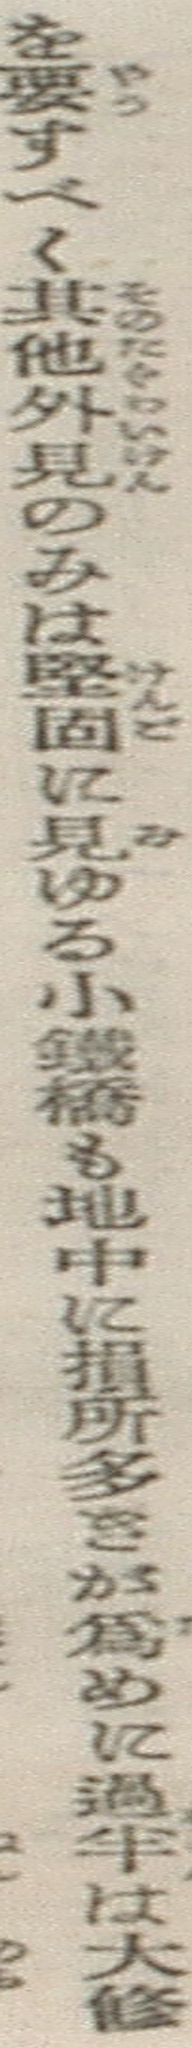を要すべく其他外観のみは堅固に見ゆる小鐡橋も地中に損所多きが為めに過半は大修
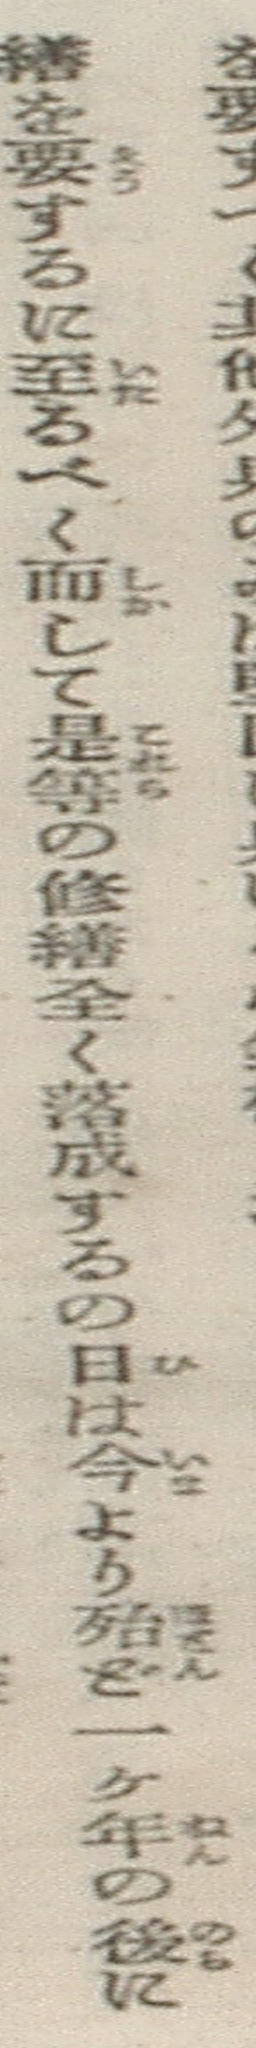繕を要するに至るべく而して是等の修繕全く落成するの日は今より殆ど一ヶ年の後に
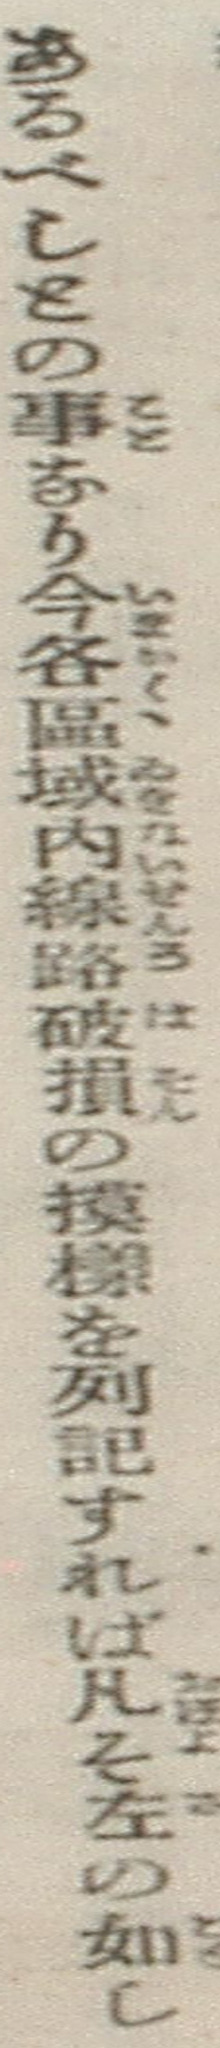あるべしとの事なり今各區域内線路破損の模様を列記すれば凡そ左の如し
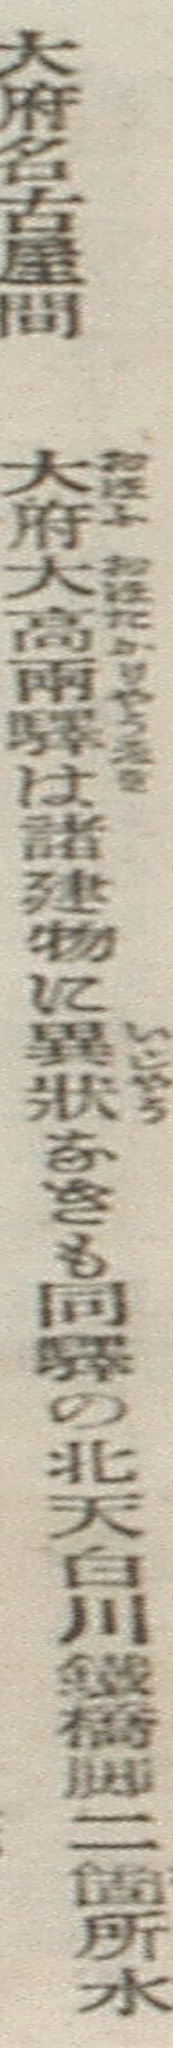大府名古屋間大府大高兩驛は諸建物に異状なきも同驛の北天白川鐡橋脚二箇所水
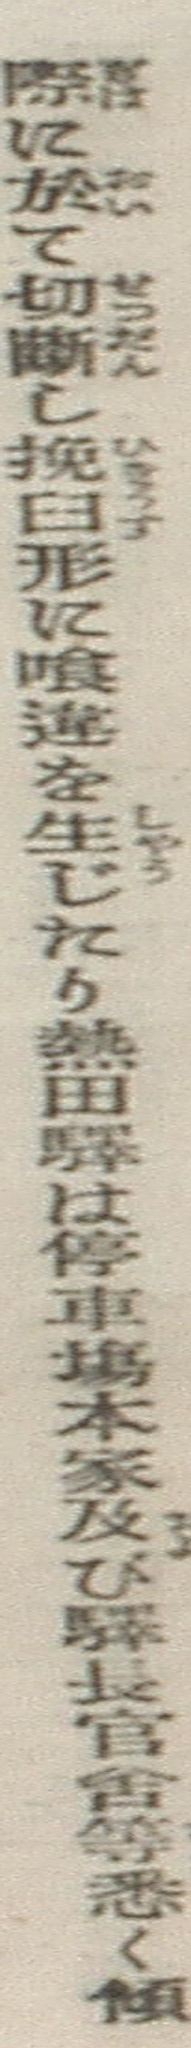際に於て切断し挽臼形に喰違を生じたり熱田驛は停車場本家及び驛長官舎等悉く傾
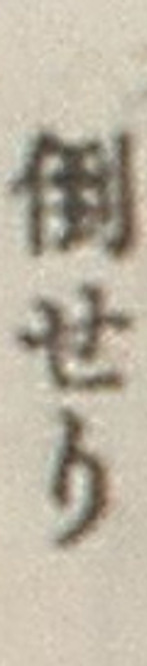倒せり

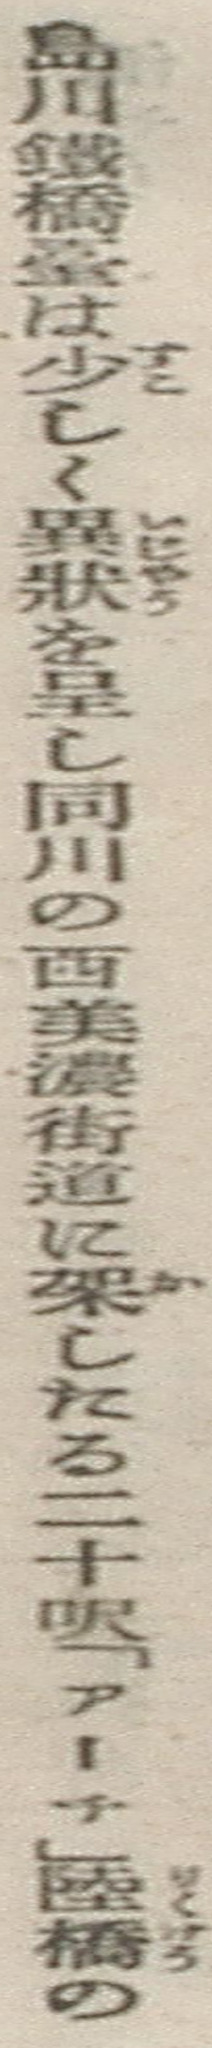島川鐡橋臺は少しく異状を呈し同川の西美濃街道に架したる二十呎「アーチ」陸橋の
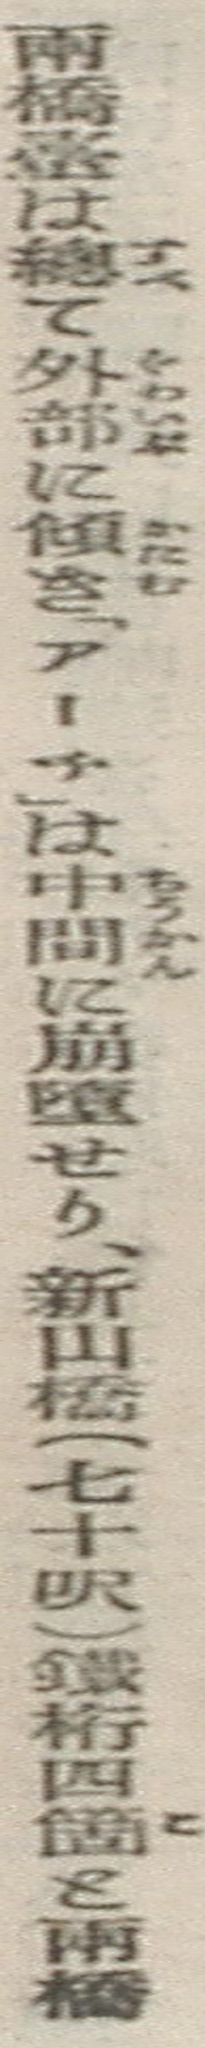兩橋臺は総て外部に傾き「アーチ」は中間に崩堕せり、新山橋鐡桁四箇と兩橋
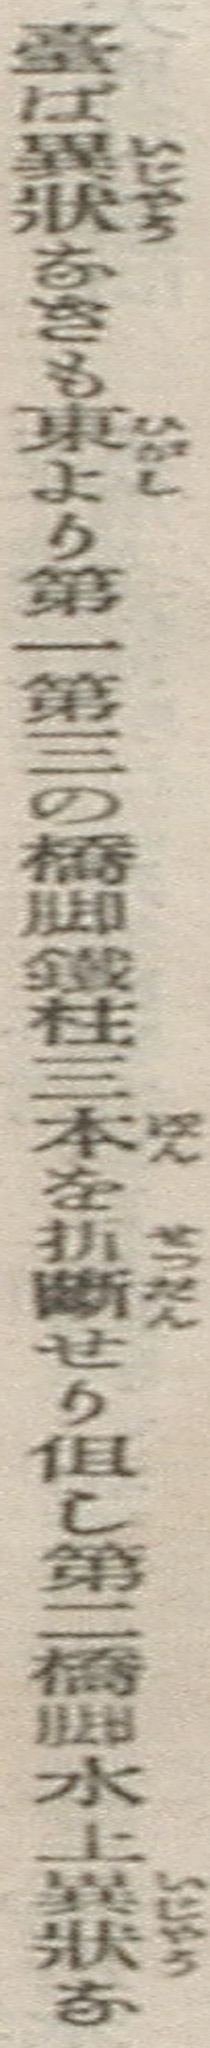臺は異状なきも東より第一第三の橋脚鐡柱三本を切斷せり但し第二橋脚水上異状な
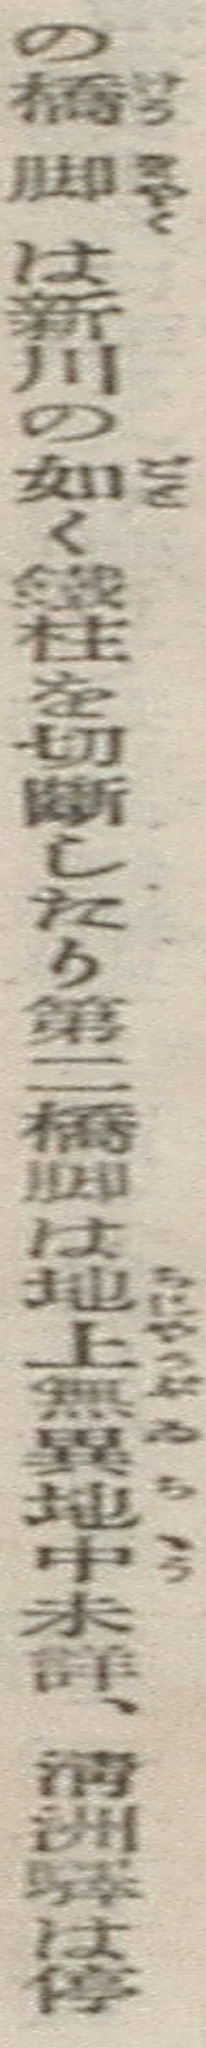の橋脚は新川の如く鐡柱を切斷したり第二橋脚は地上無異地中未詳、清州驛は停
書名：愛知岐阜福井三県　大地震見聞録（内題）
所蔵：東京大学地震研究所図書室 Earthquake Research Institute Library, The University of Tokyo, JAPAN
